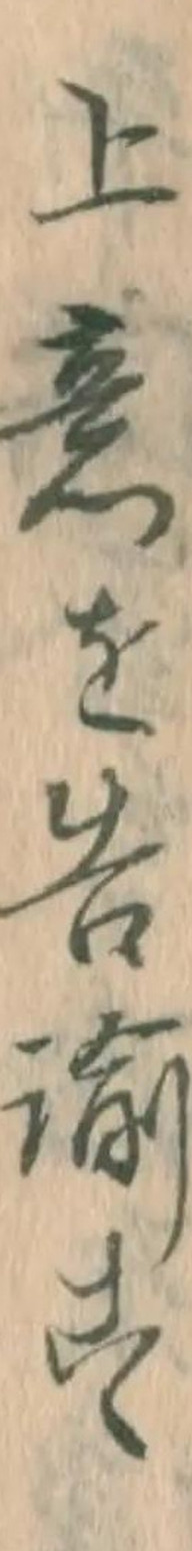上意を告諭春
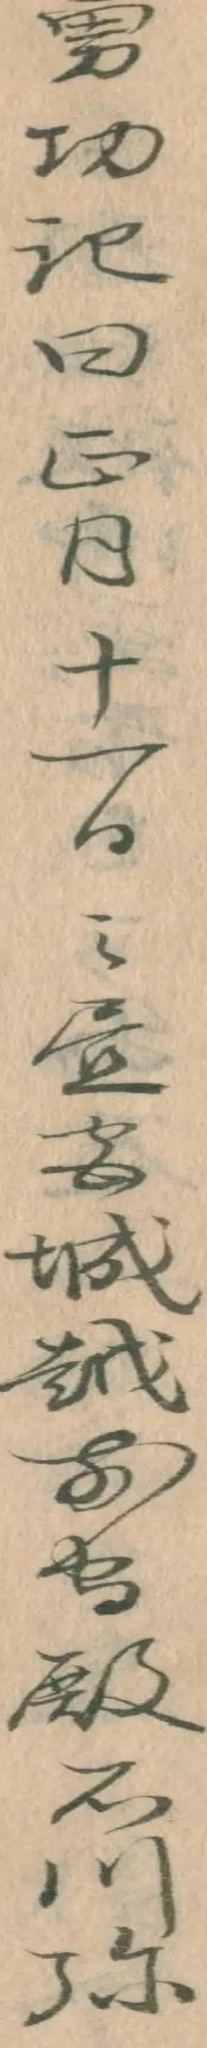勇功記曰正月十一日之昼宮城越前守殿石川弥
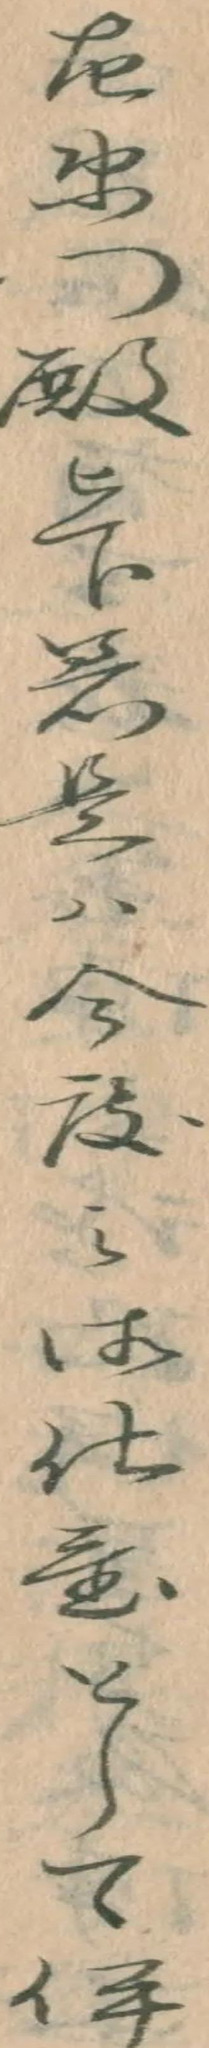左衛門殿被下着是は今度之御仕置として伊
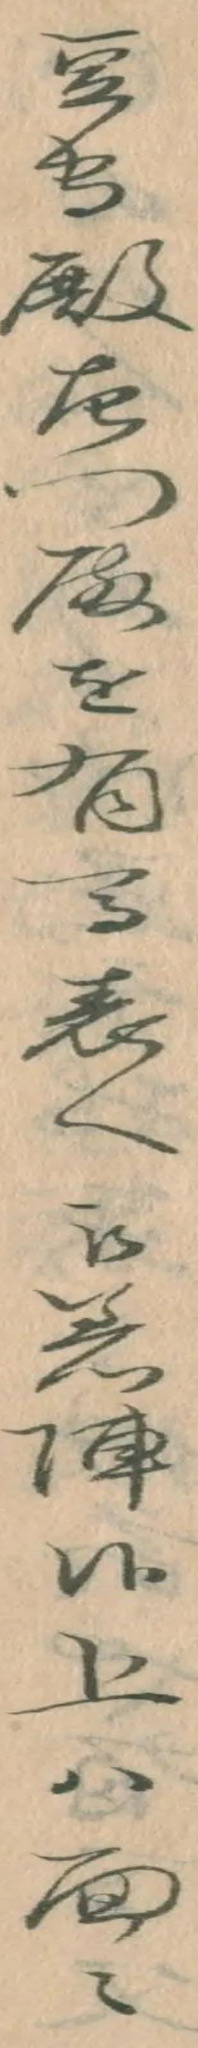豆守殿左門殿を有馬表へ被着陣候上は面々
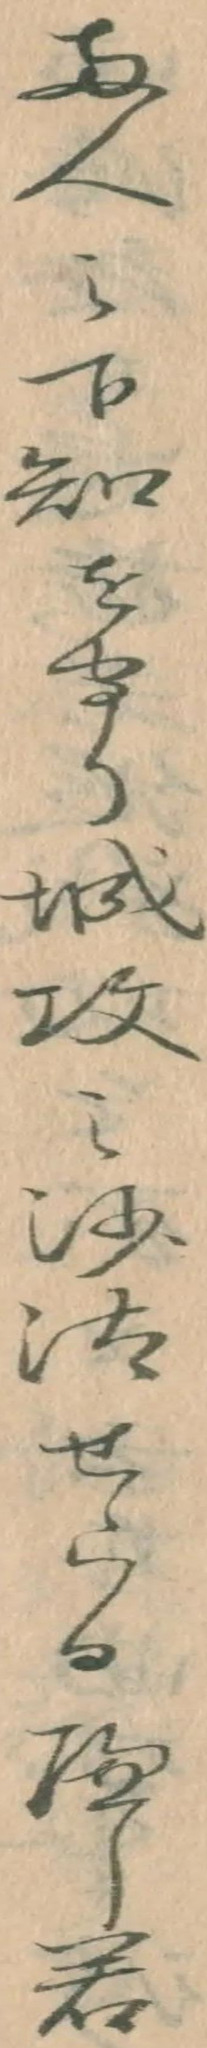両人之下知を守り城攻之沙汰せらる扁し若

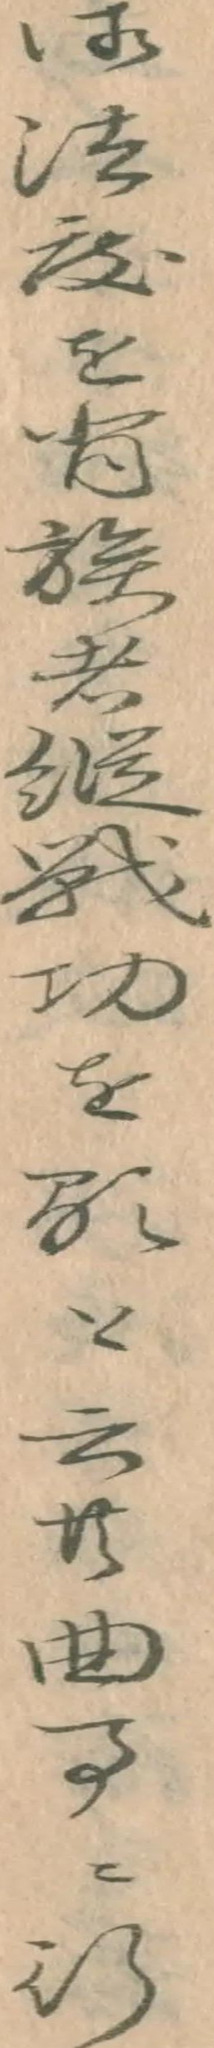御法度を背族者縦戦功を顕と云共曲事に行
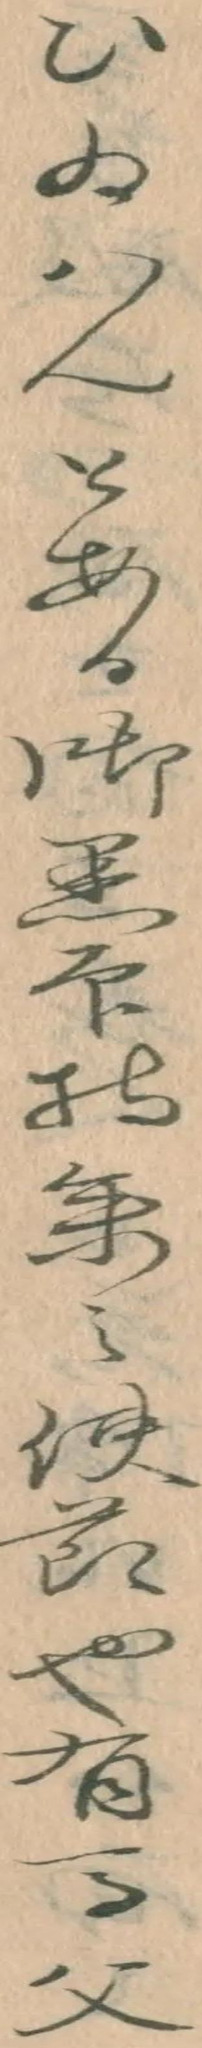ひゐはんとある御黒印持参之使節や有馬父
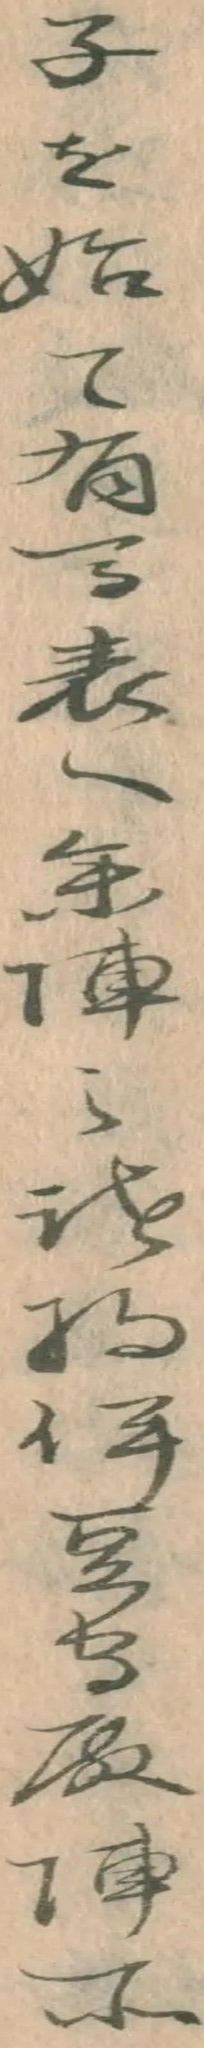子を始て有馬表へ参陣之諸物伊豆守殿陣所
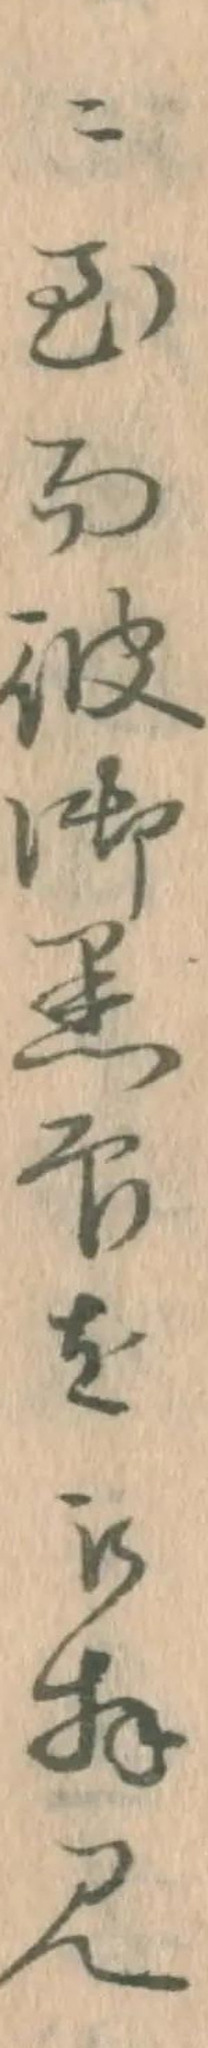に至而彼御黒印を被拝見
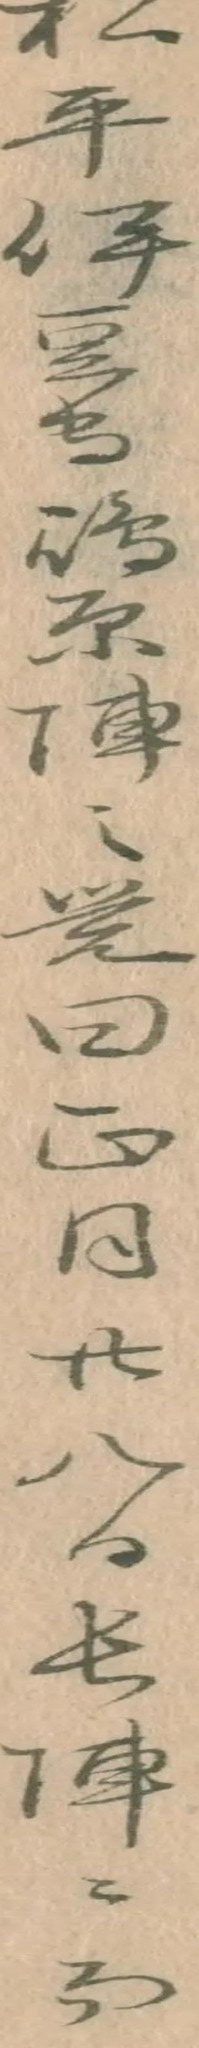松平伊豆守島原陣之覚曰正月廿八日長陣に而
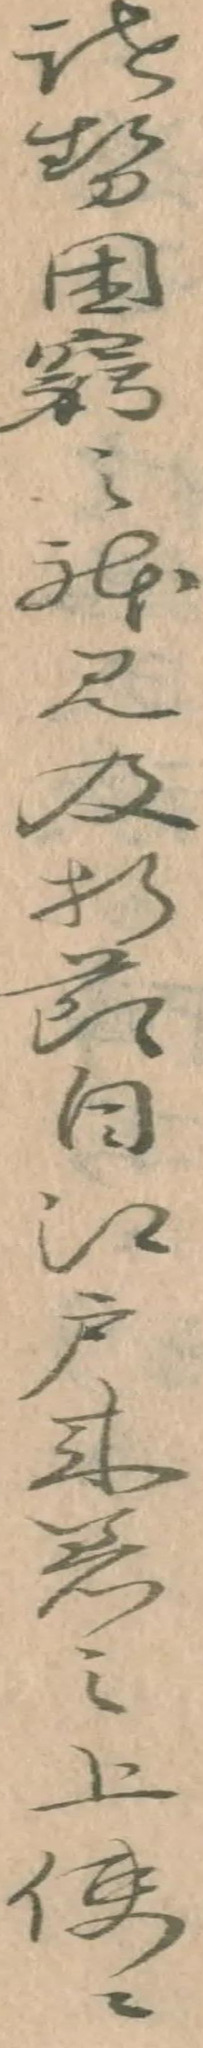諸勢困窮之躰見及折節自江戸来着之上使に
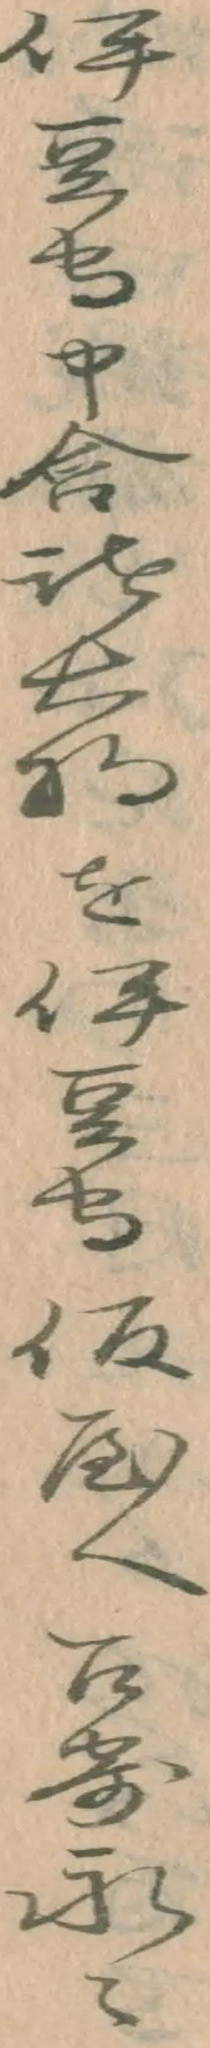伊豆守申合諸大将を伊豆守仮屋へ召寄永々
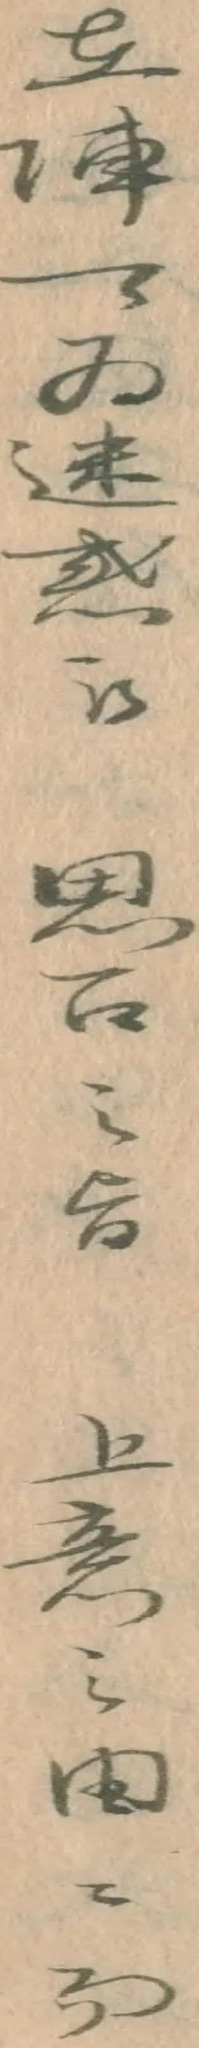在陣可ゐ迷惑被思召之旨上意之由に而
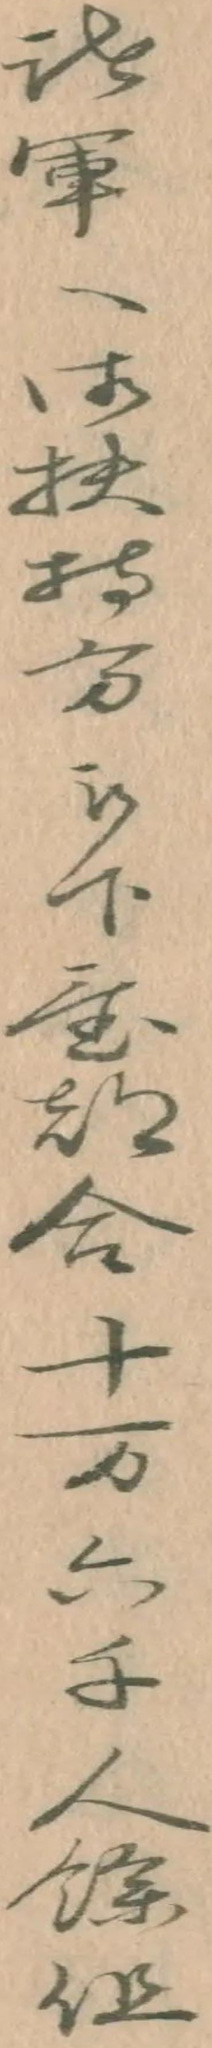諸軍へ御扶持方被下置都合十万六千人余但
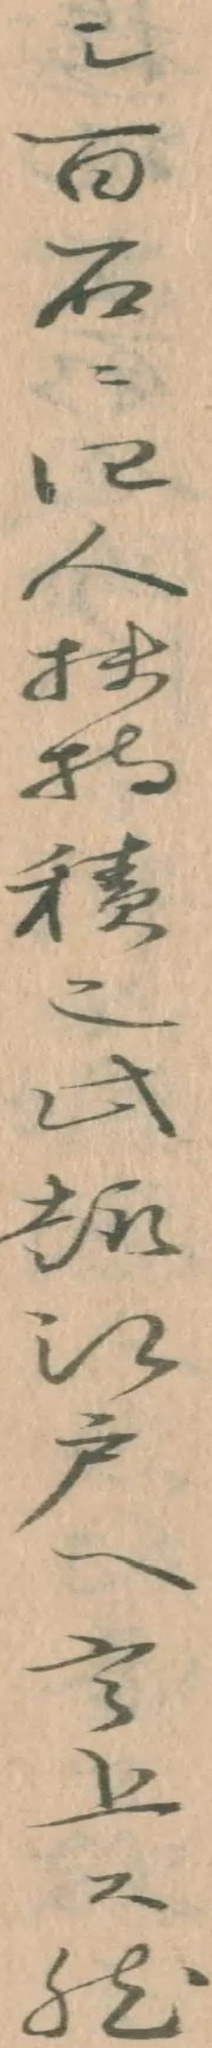し百石に四人扶持積也此趣江戸へ言上す然
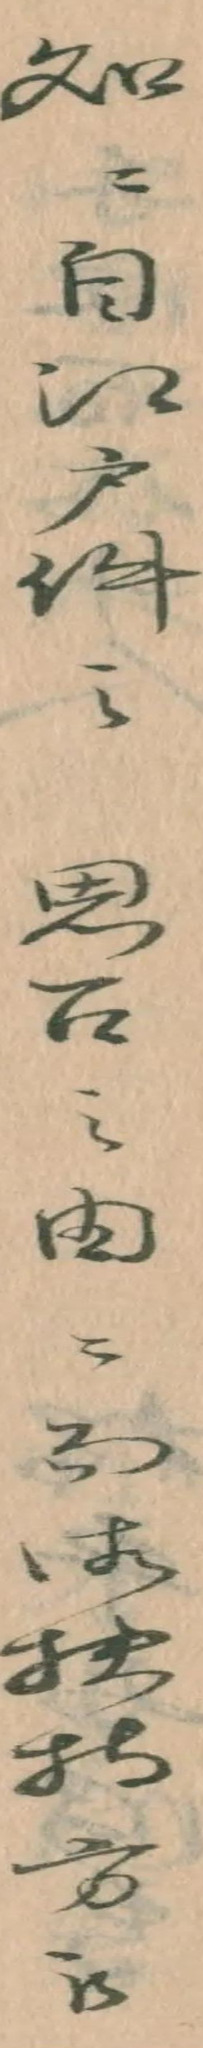処に自江戸件之思召之由に而御扶持方被
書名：切支丹御退治記 49巻. [6]
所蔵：国立国会図書館 National Diet Library, JAPAN
